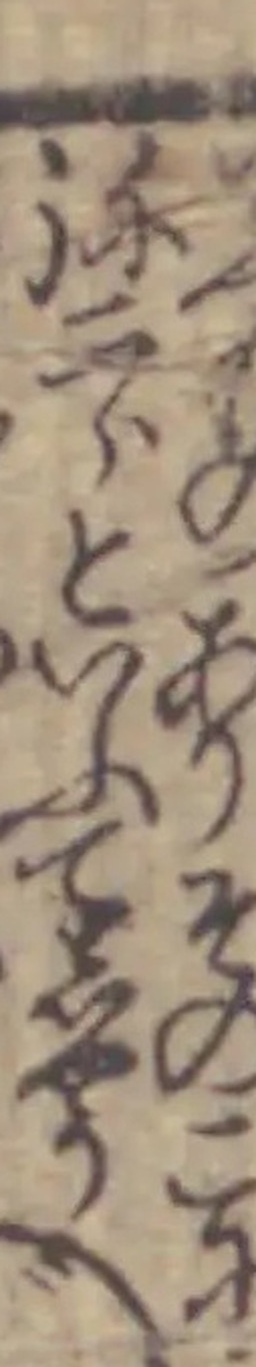弥二郎といふてしやう
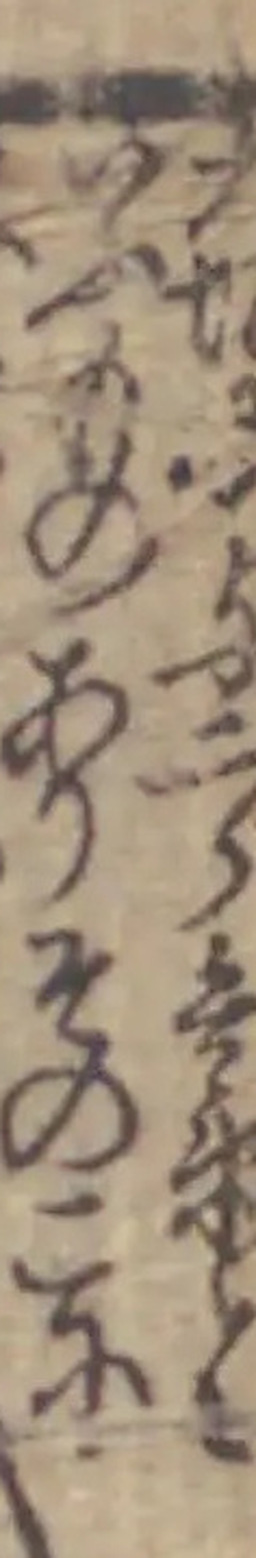いふものありそのこに
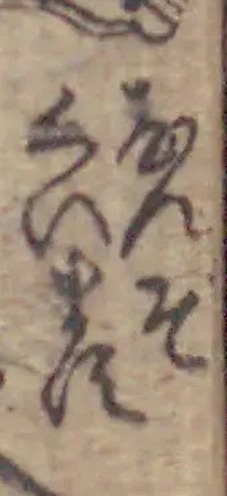くいます
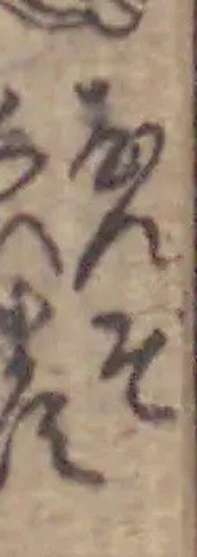なんそ
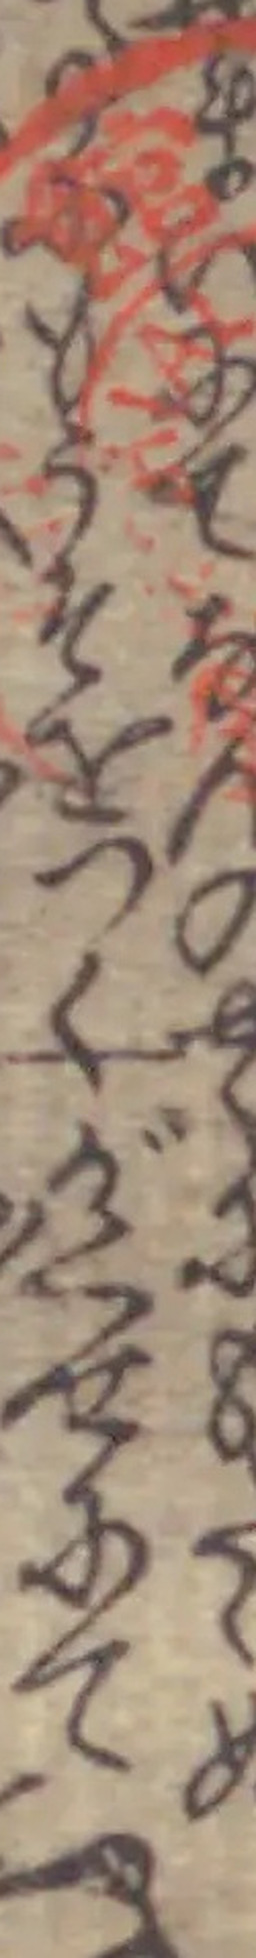事にもうそをつくがくせにて
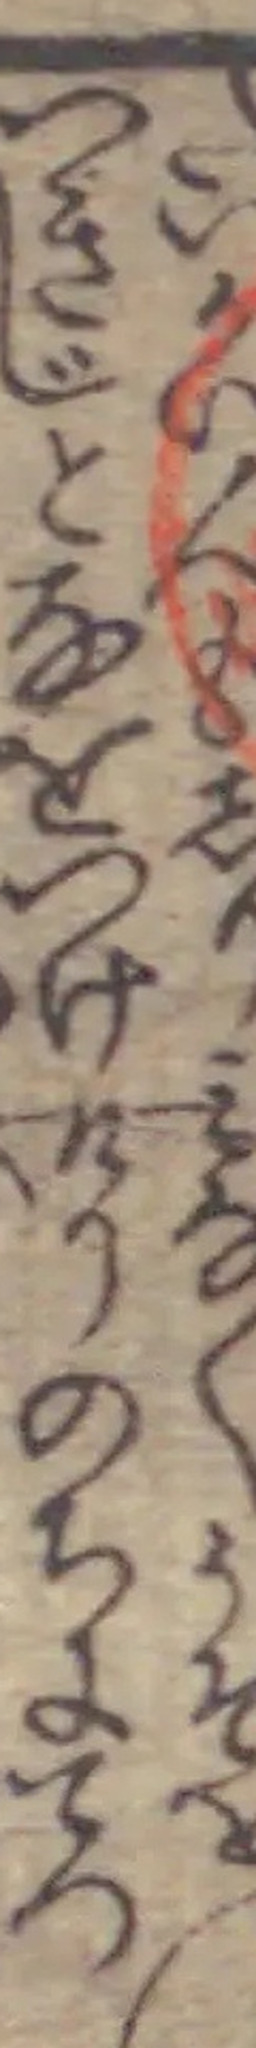つきじとなをつけけりのちにてつ
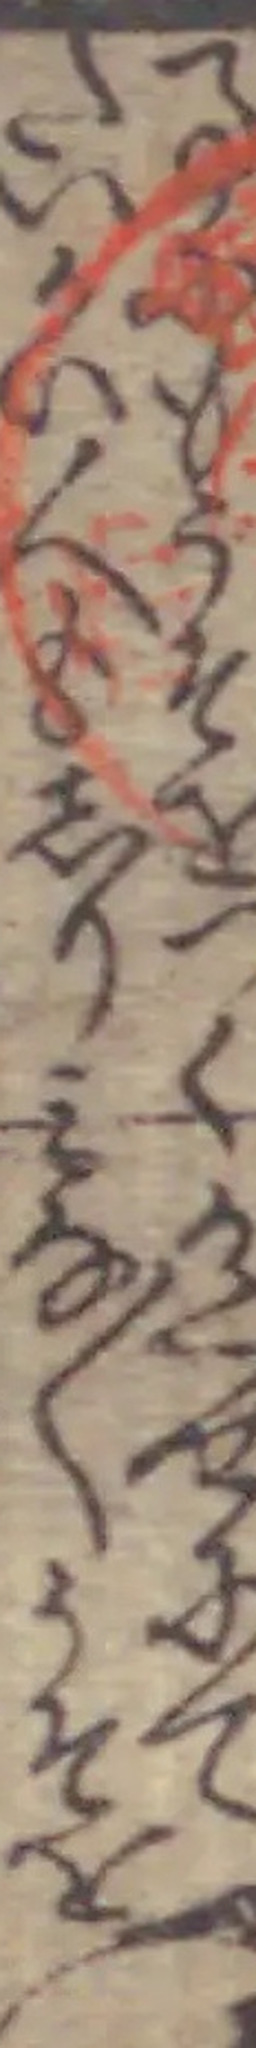たいかい人もしりみな〳〵うそを
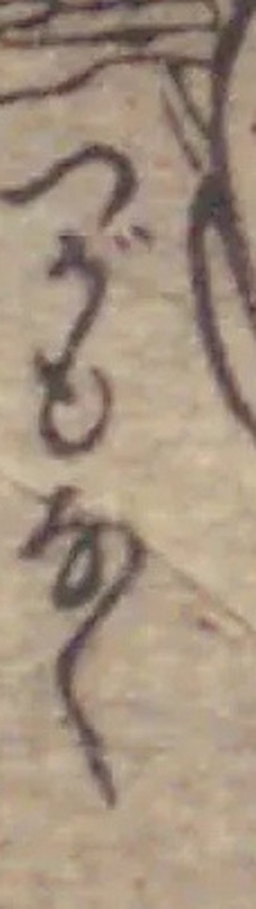つがもなく
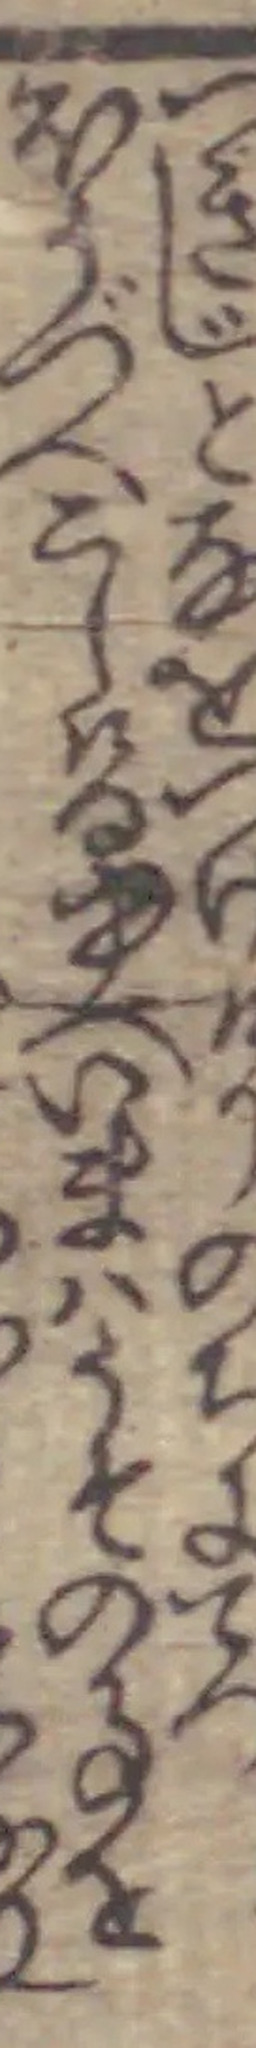ほうづへこしけるゆえいまはうその事を
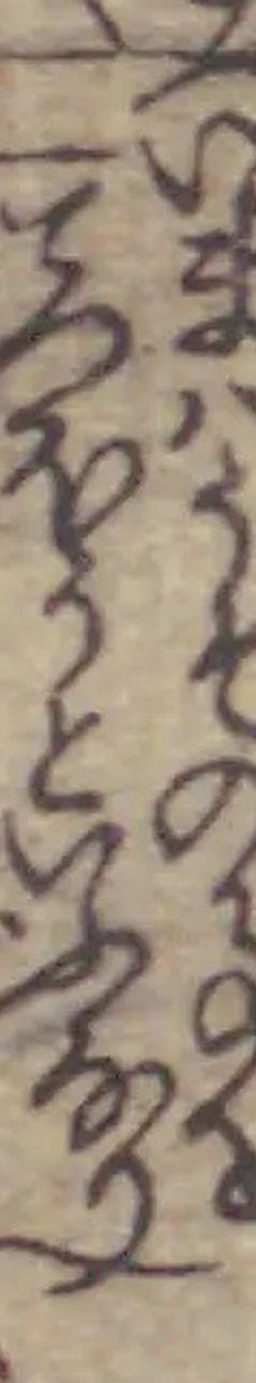てつほうといふなり
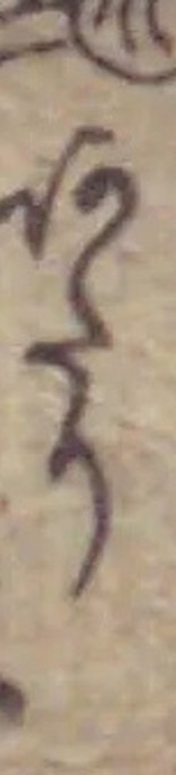あたり
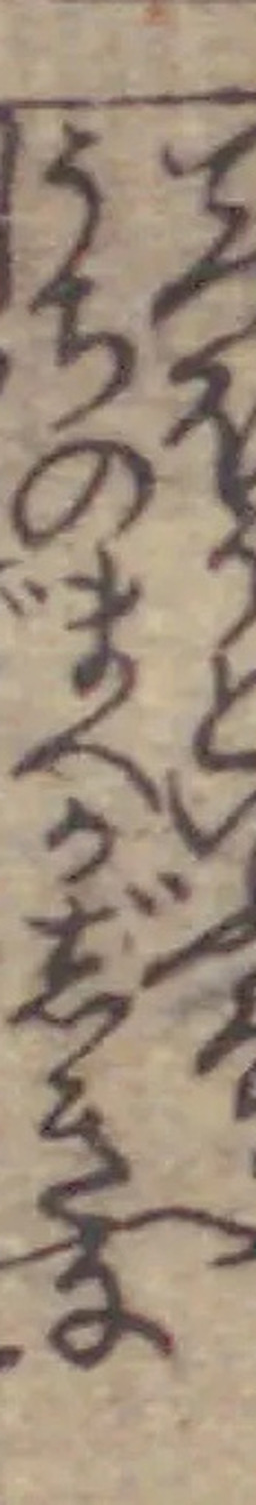うちのまへがじきに
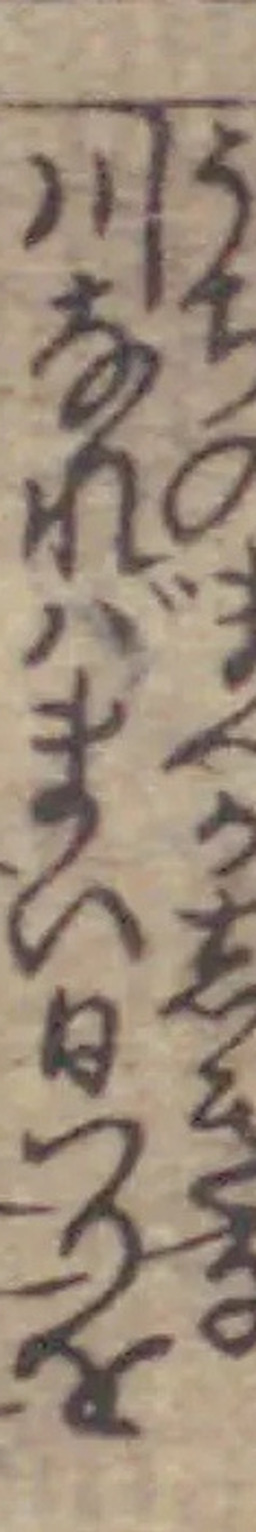川なればまい日つりを
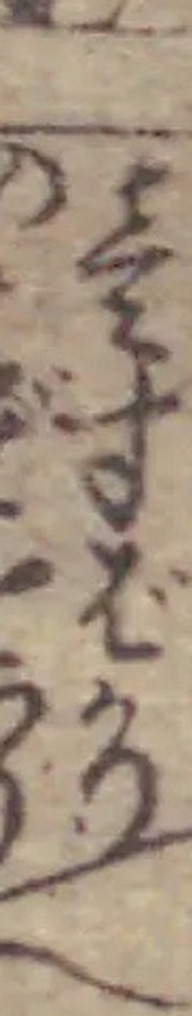壱寸ばかり
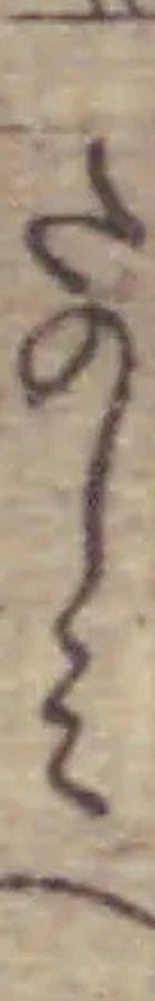たのしみ
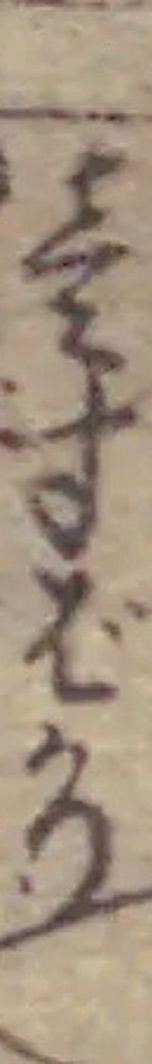壱寸ばかり
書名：虚言弥二郎傾城誠 3巻
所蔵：国立国会図書館 National Diet Library, JAPAN
